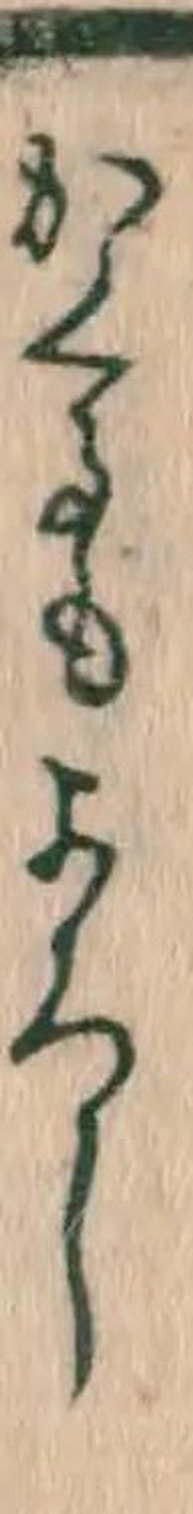かくるもよろし
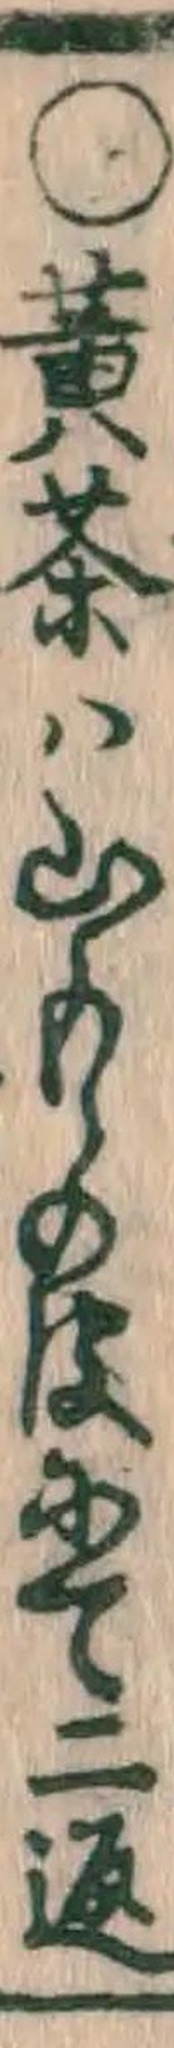○黄茶は山もゝの皮にて二返
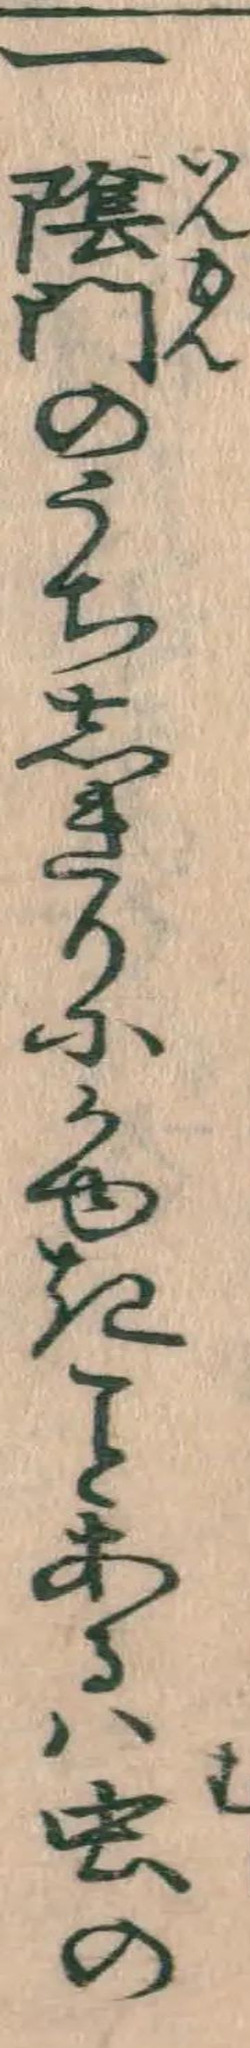一陰門のうちしきりにかゆきことあるは虫の
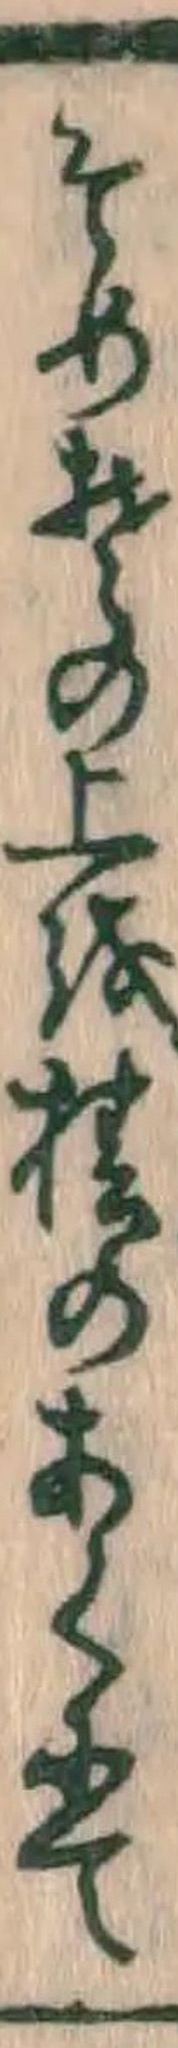そめその上を椿のあくにて
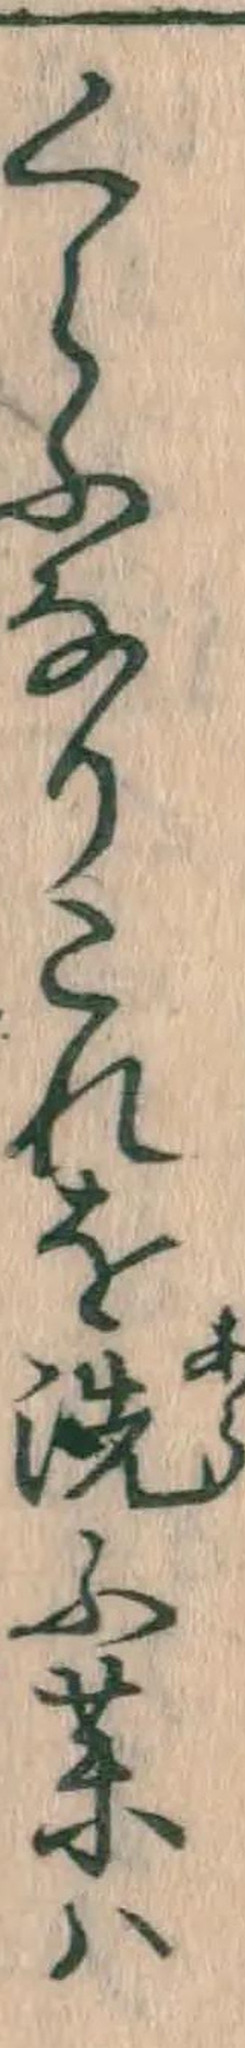くらふなりこれをあ洗ふ薬は
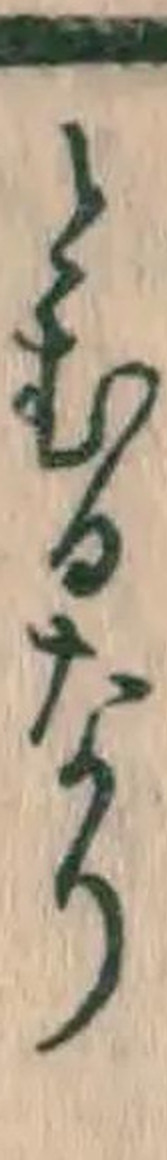とむるなり
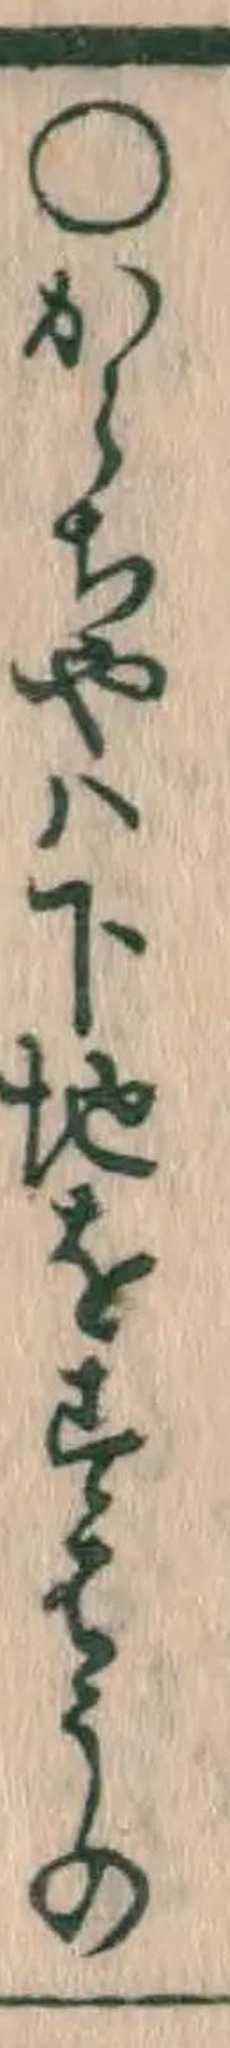○からちやは下地をすはうの
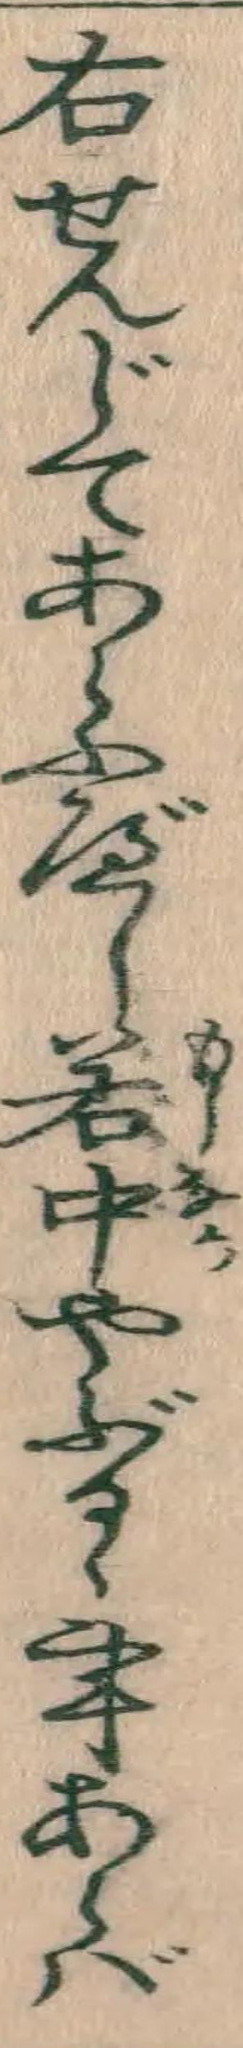右せんじてあらふべし若中やぶるゝ事あらば
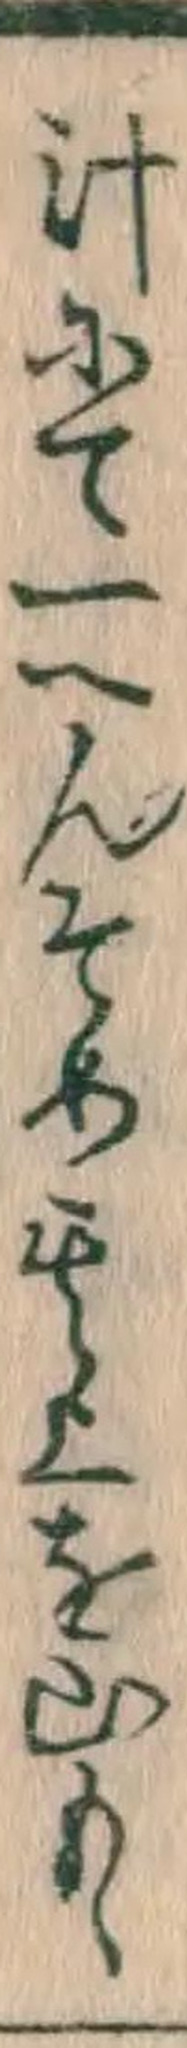汁にて一へんそめ其上を山もゝ
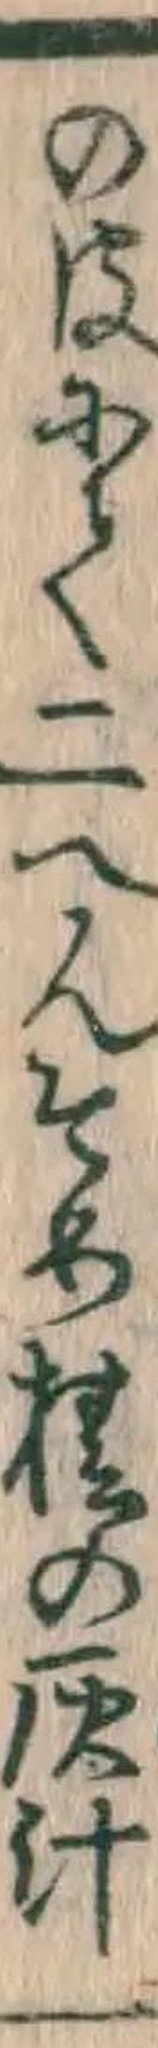の皮にて二へんそめ椿の灰汁
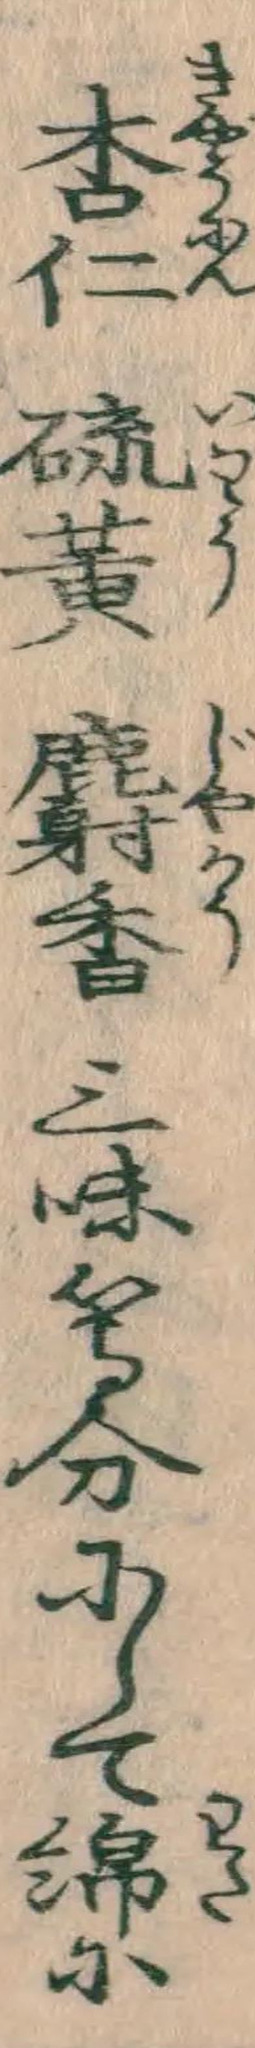杏仁硫黄麝香三味等分にして綿に
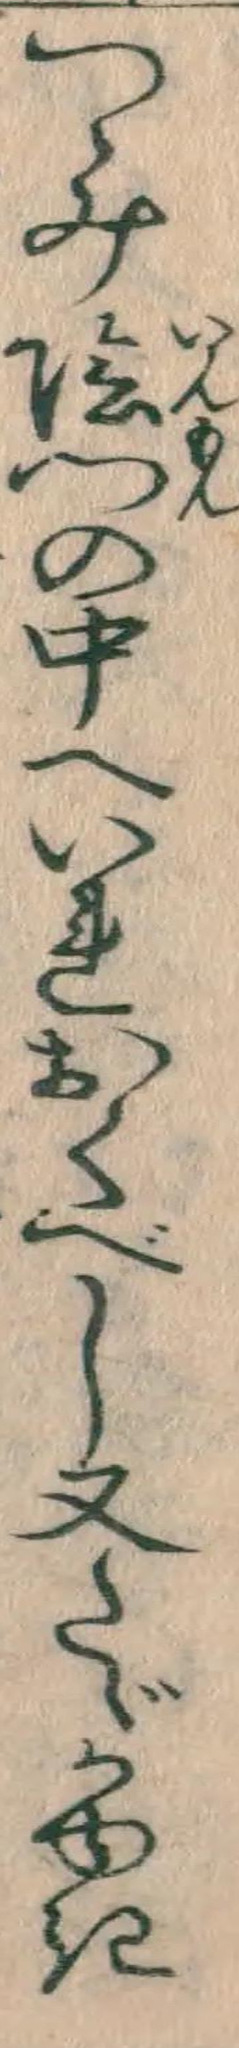つゝみ陰門の中へいれおくべし又たゞかゆき
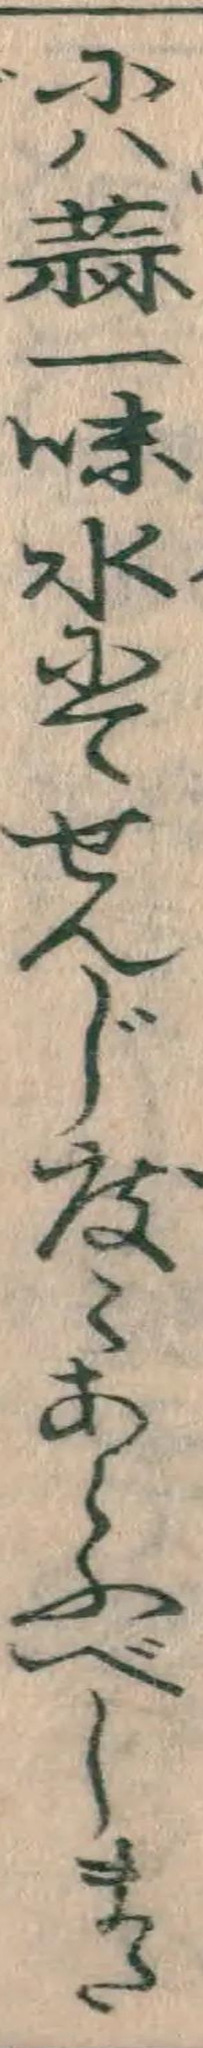には蒜一味水にてせんじ度々あらふべしまた
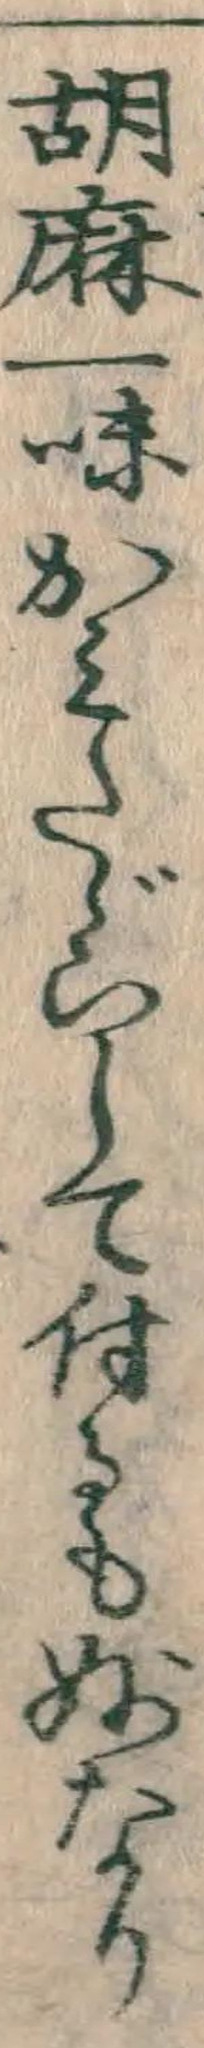胡麻一味かみたゞらして付るも妙なり
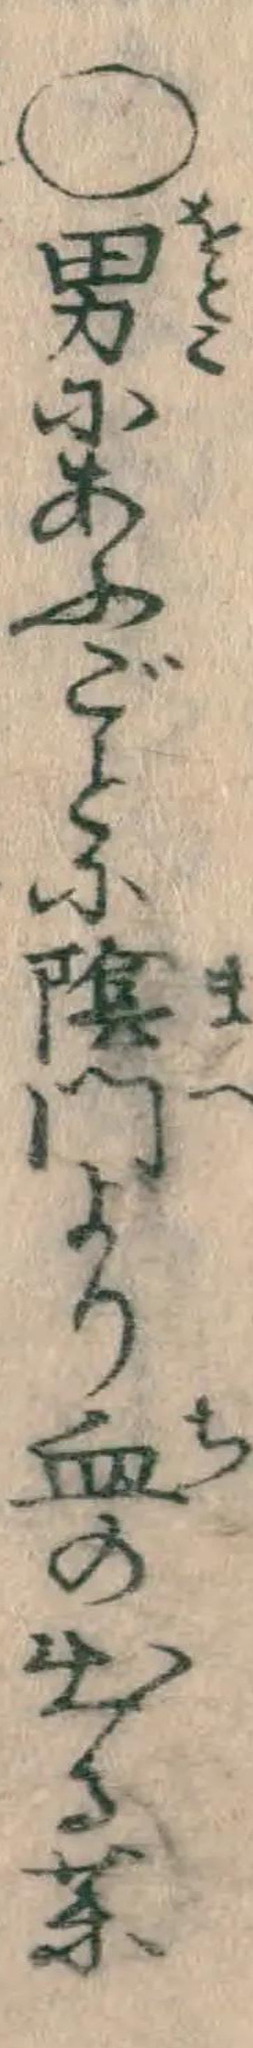○男にあふごとに陰門より血の出る薬
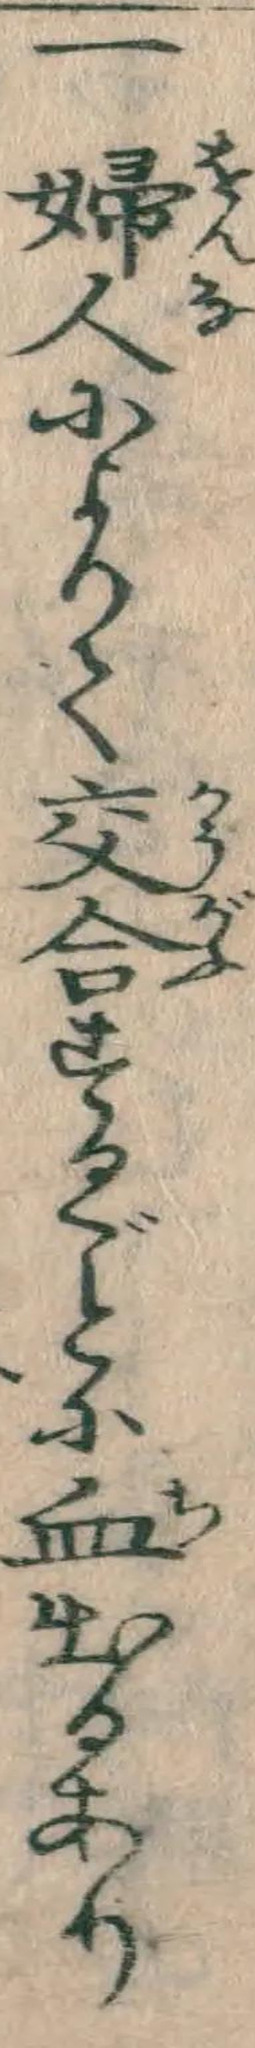一婦人によりて交合するごとに血出るあり
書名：広益秘事大全 3巻. [3]
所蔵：国立国会図書館 National Diet Library, JAPAN
